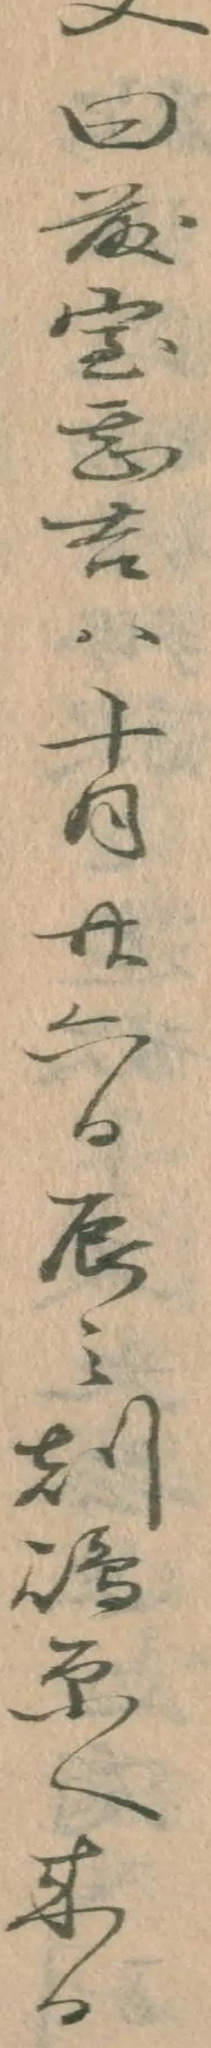又日藤室甚吉は十月廿六日辰之刻島原へ来る
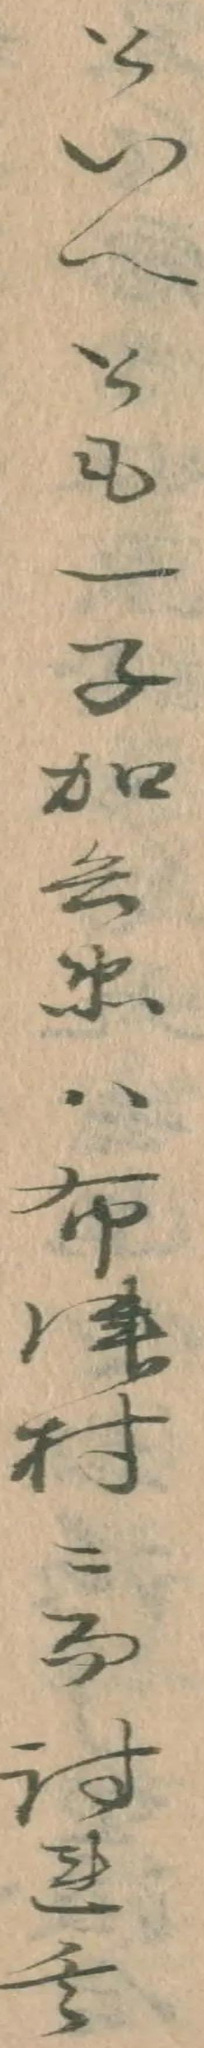といへとも一子加兵衛は布津村に而討れ其
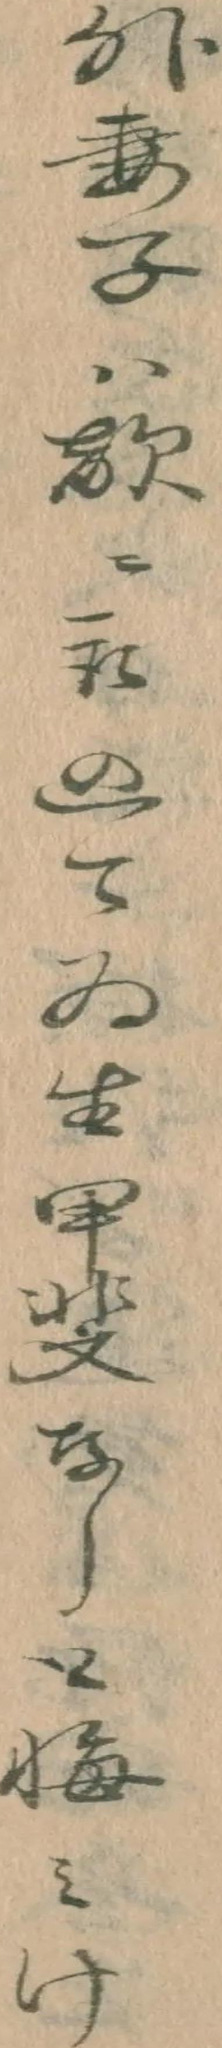外妻子は敵に取込て為生甲斐なしと悔みけ
